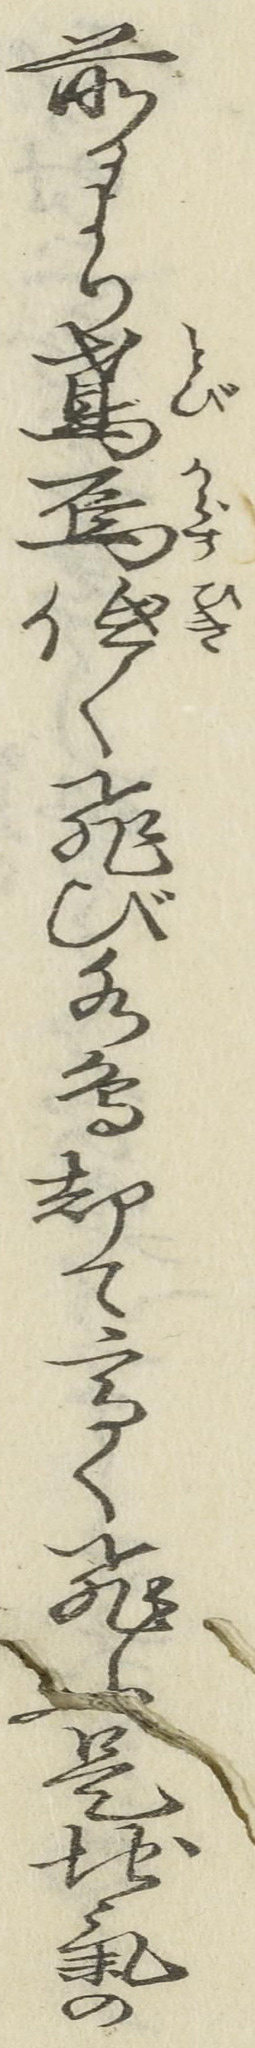前日より鳶烏低く飛び水鳥却て高く飛ふ是地気の
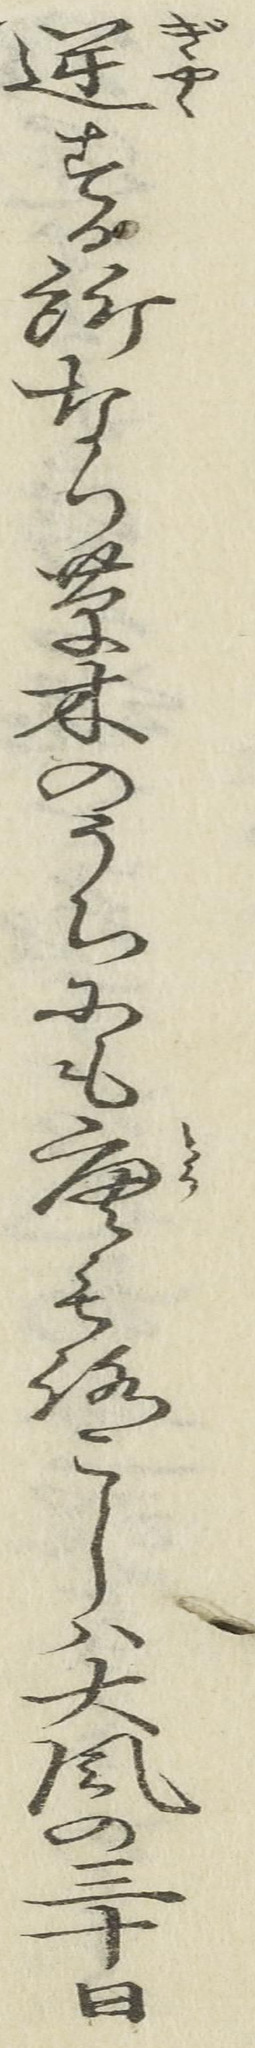逆する所なり草木のうちにも唐もろこしは大風の三十日
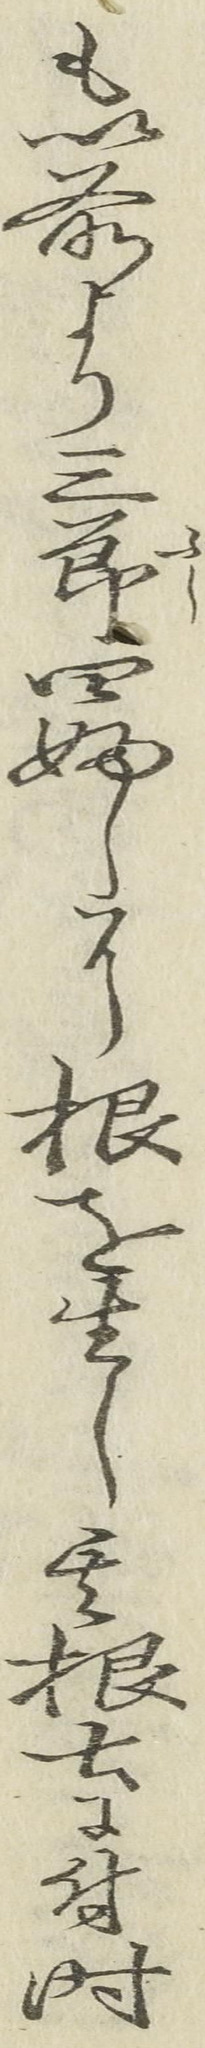も以前より三節四ふしに根を生し其根土に付時
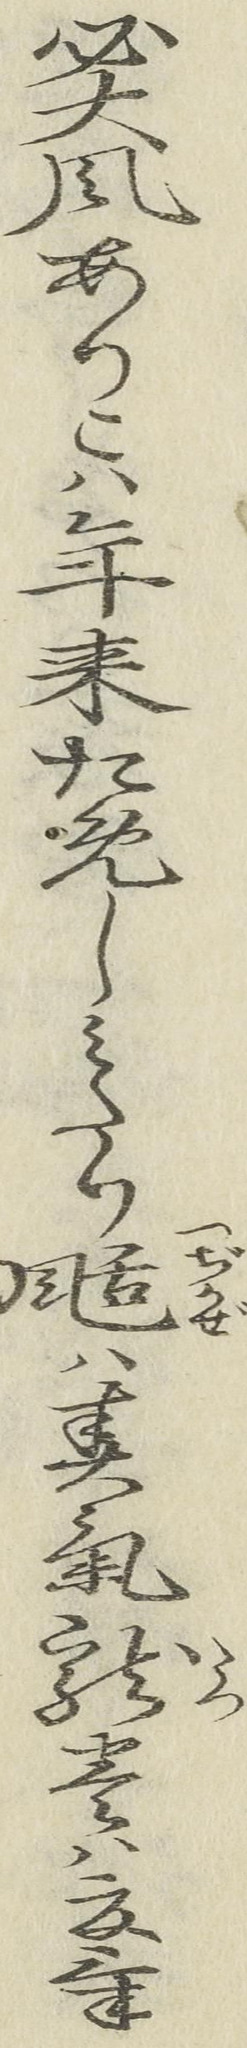必大風ありこは年来ためしみたり飃？は春気龍巻は夏気
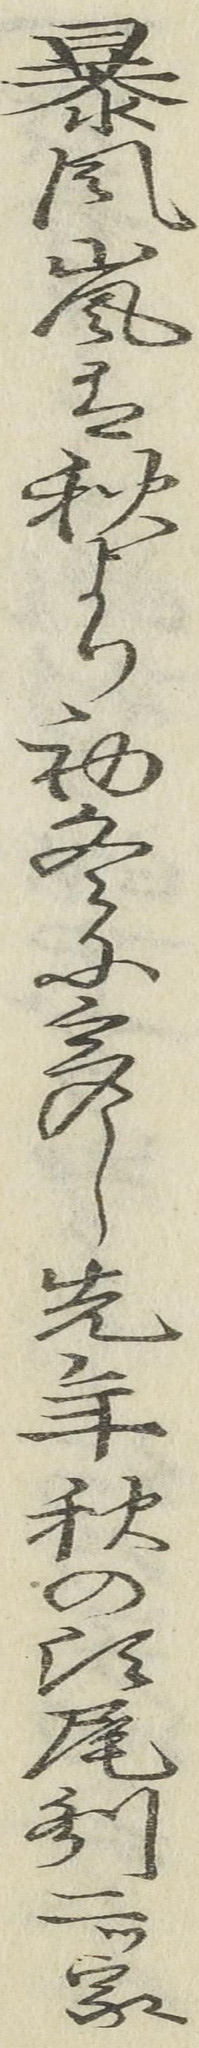暴風嵐は秋より初冬に多し先年秋の頃尾州二ツ家
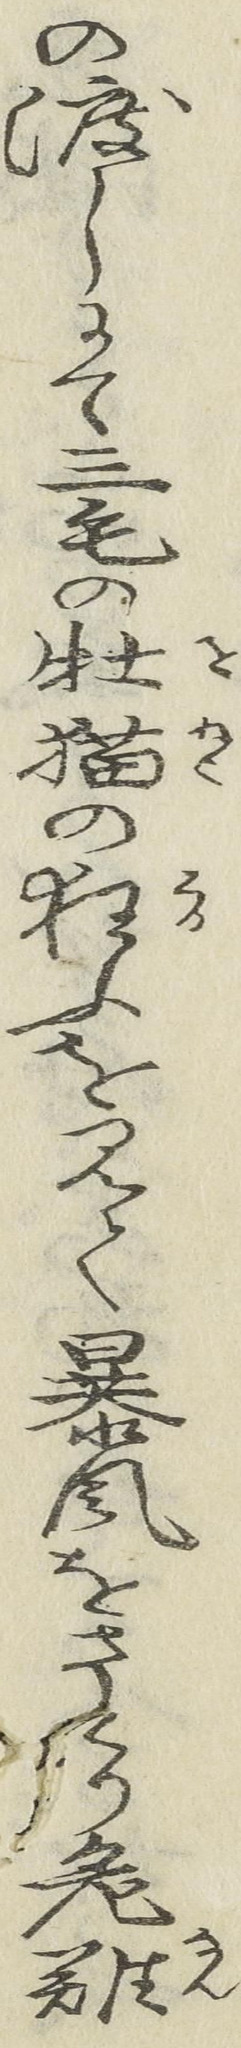の渡しにて三宅の牡猫の狂ふを見て暴風をさとり危難
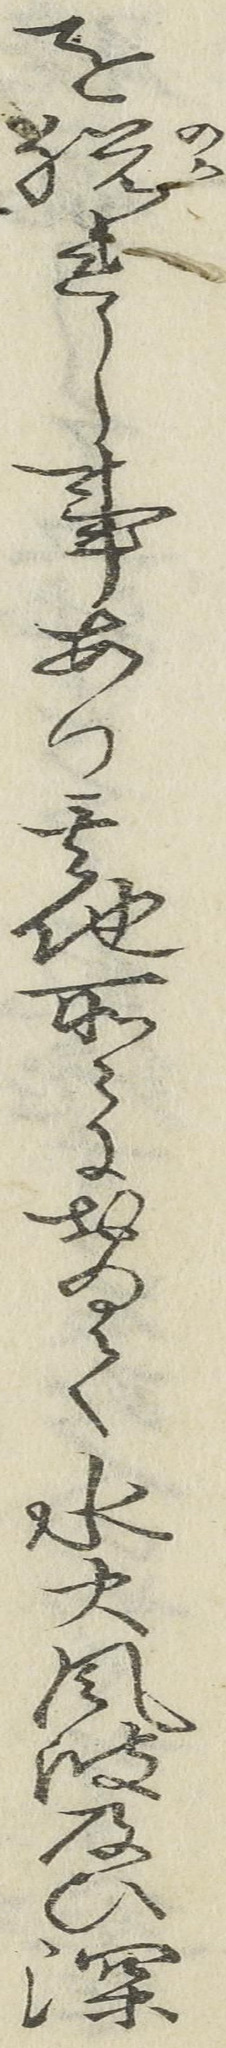を脱れし事あり其他所々におゐて水日風時及ひ深
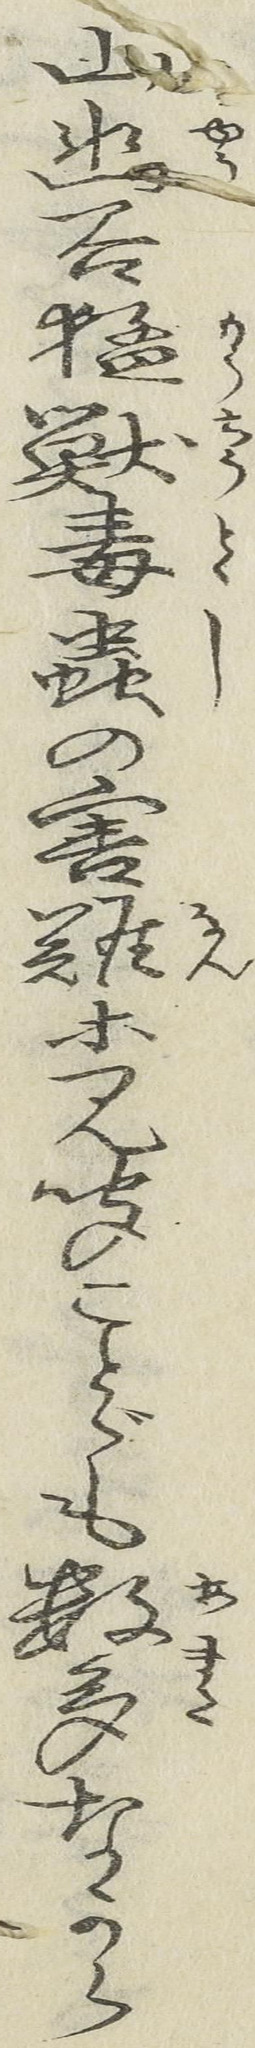山幽谷猛獣毒蟲の害難等見聞こと〴〵も数多なから
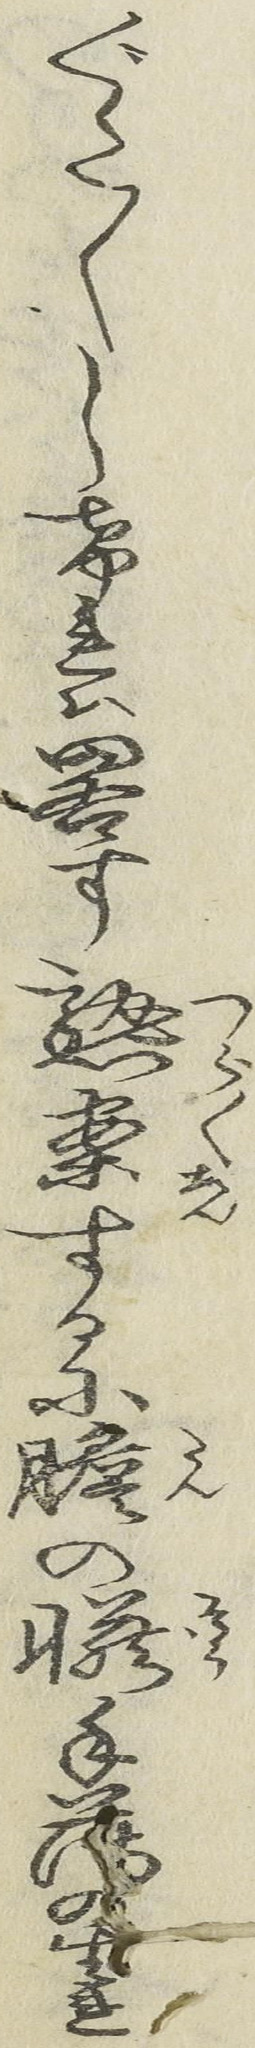ぐた〳〵しけれは略す熟案するに膽の臟手薄？の生れ

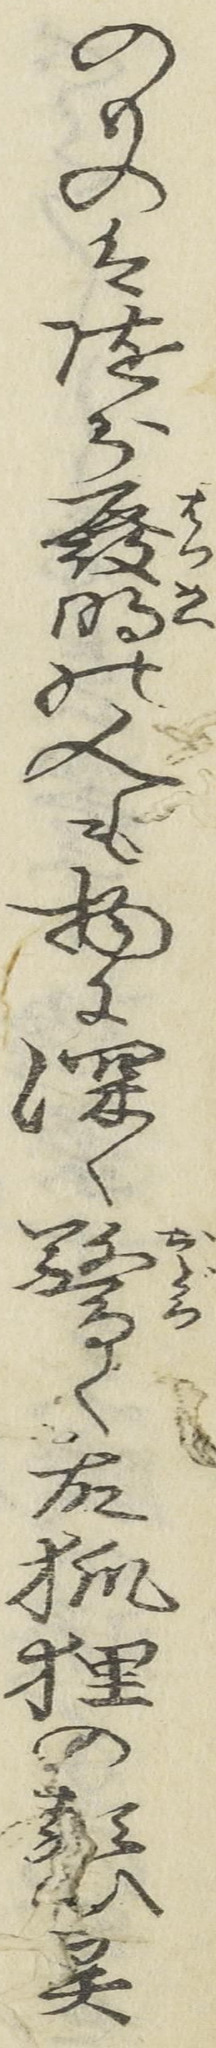のものは随分発明の人も物に深く驚く故狐狸の類ひ異
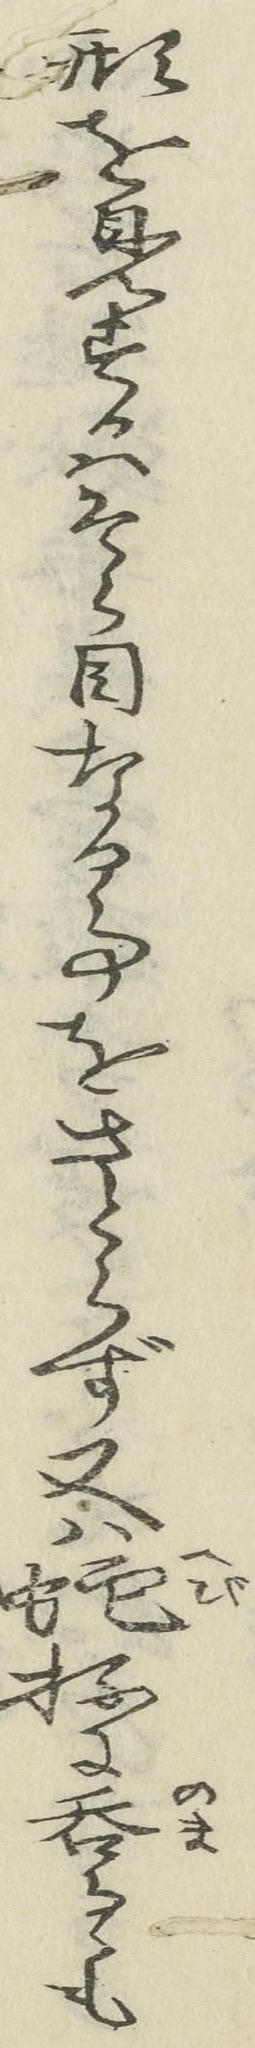形を見すかはそら目なる事をさとらず又は蛇等に呑るゝとも
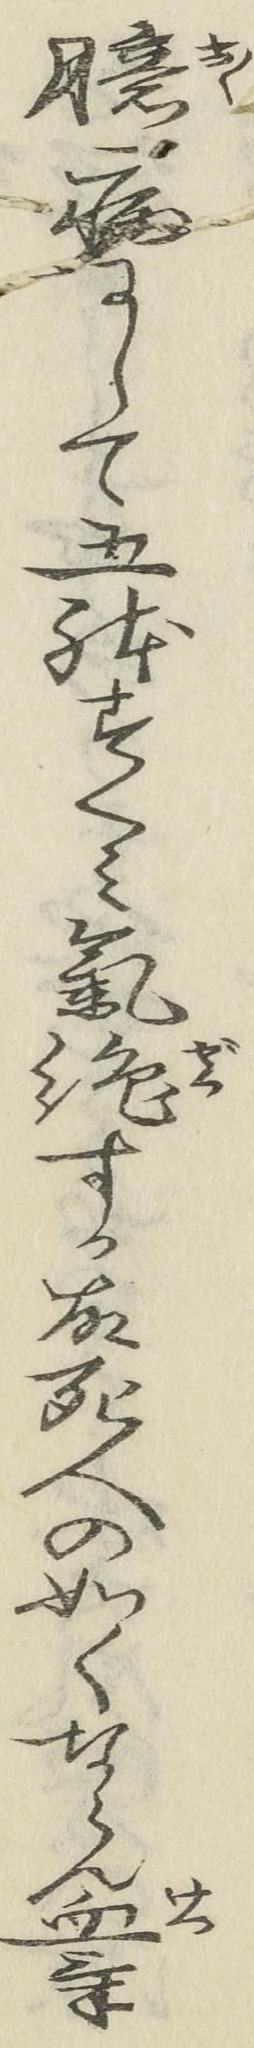臆病にして五体すくみ気絶故死人の如くならん血気
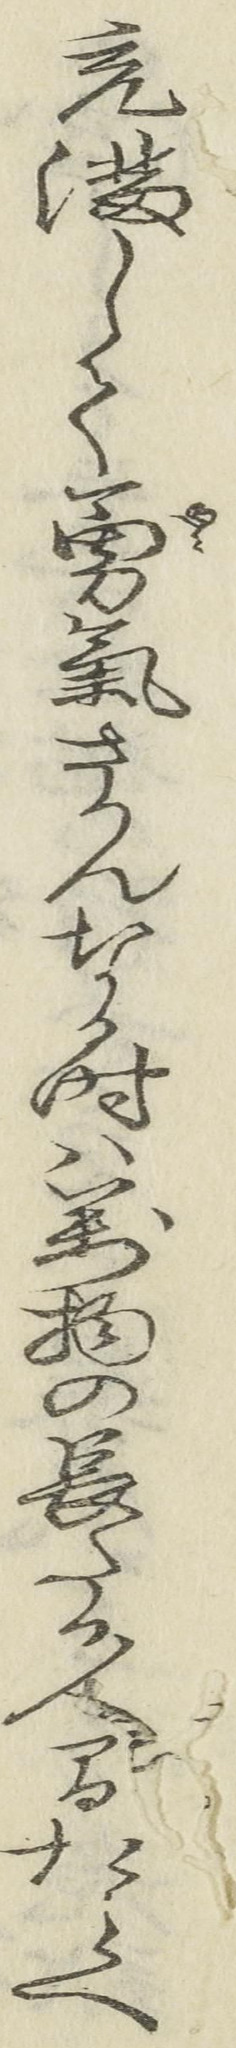充満して勇気さかんなる時は萬物の長たる人間たとへ
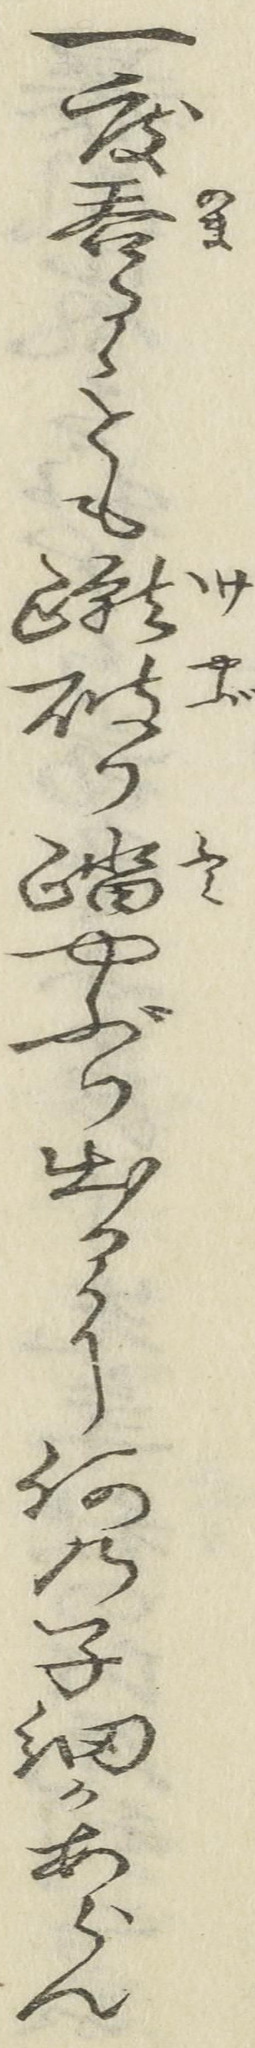一度呑るゝとも蹴破り踏やぶり出るに何の子細かあらん
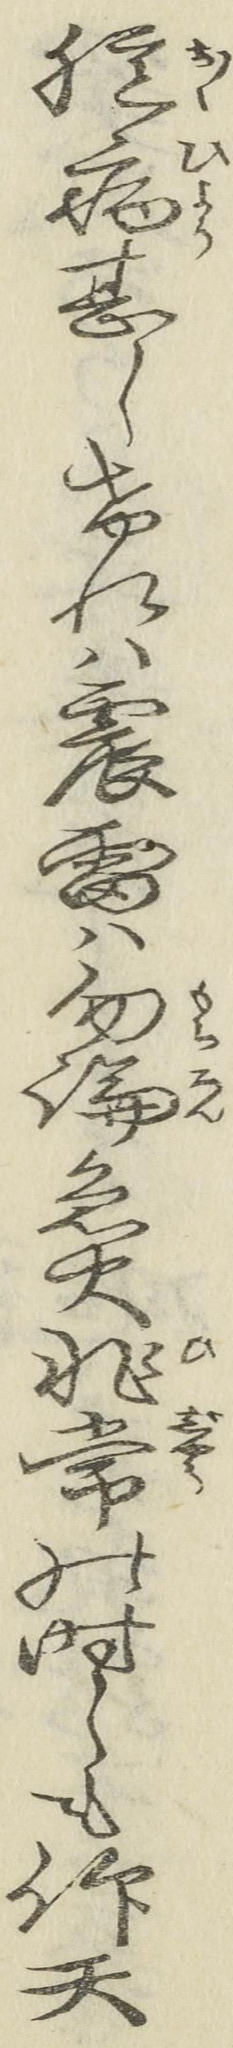臆病甚しけれは震雷は勿論急火非常の時しも仰天
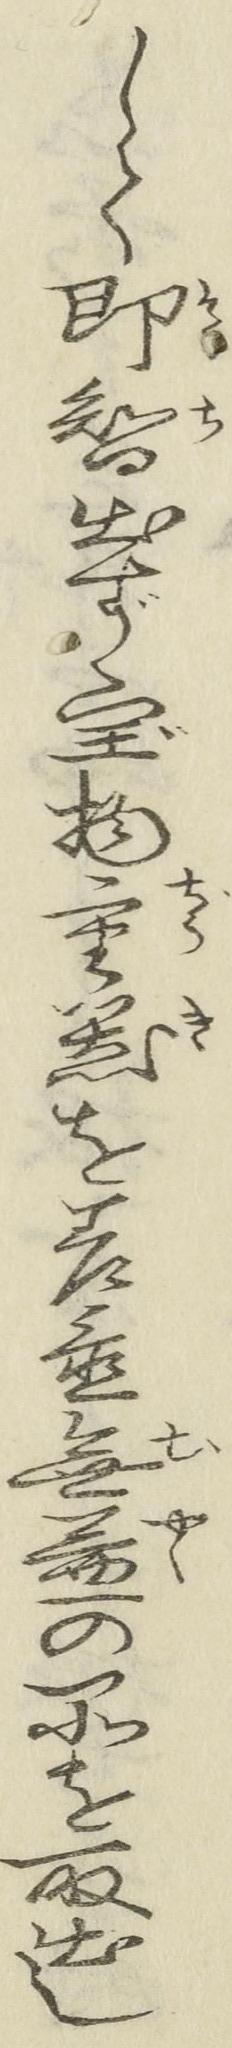して即智出ず宝物重器を差置無益の品を取出し
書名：震雷考説　全
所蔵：東京大学地震研究所図書室 Earthquake Research Institute Library, The University of Tokyo, JAPAN
